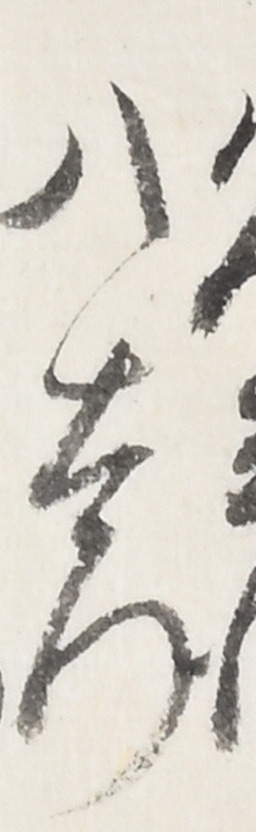八右衛門
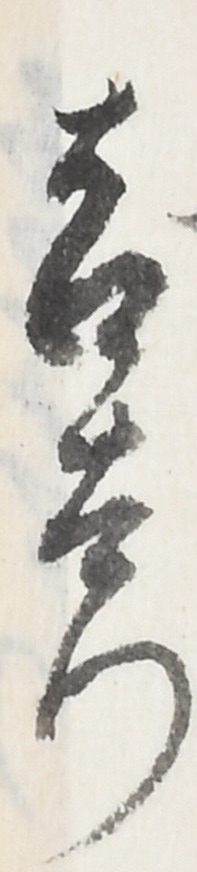吉右衛門
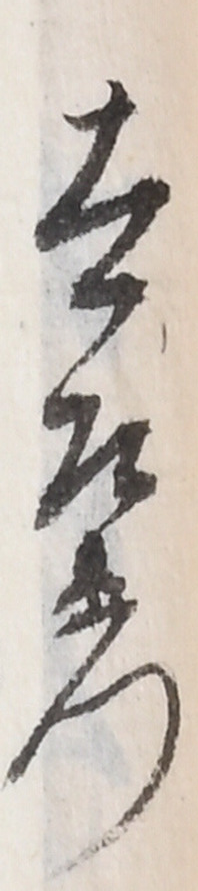太左衛門
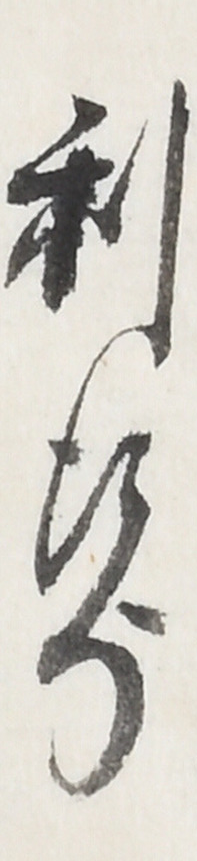利左衛門
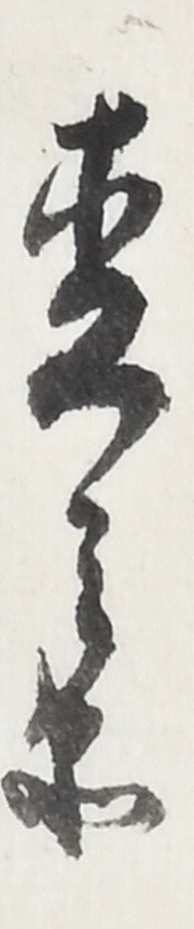七兵衛
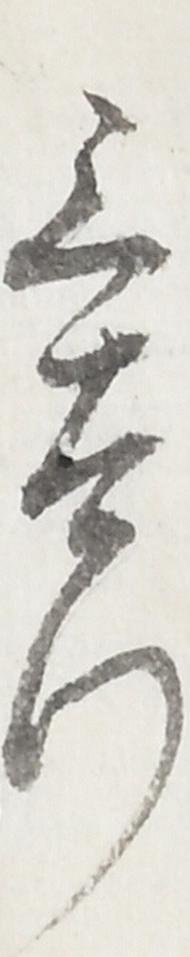三右衛門
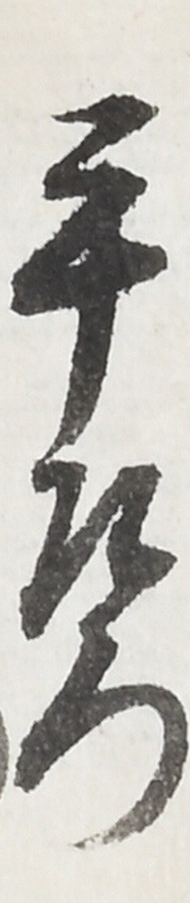平左衛門
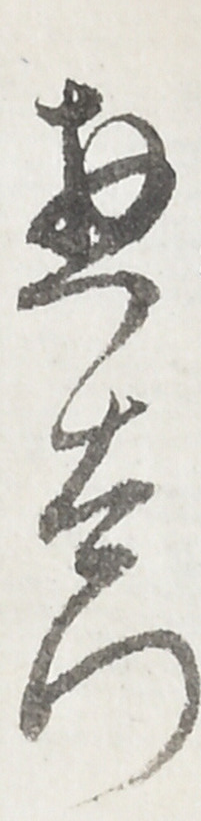惣右衛門
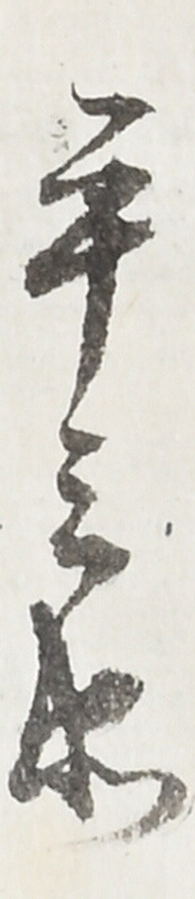平兵衛
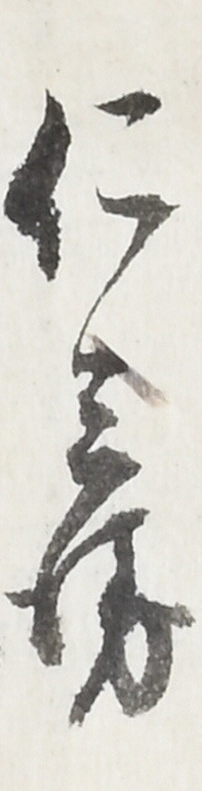仁兵衛
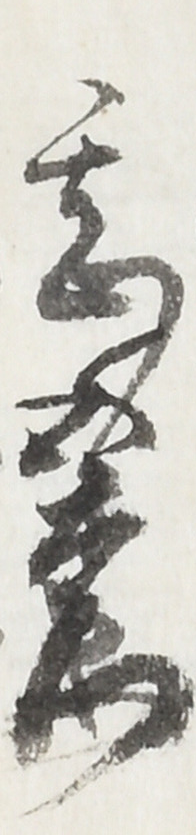甚五右衛門

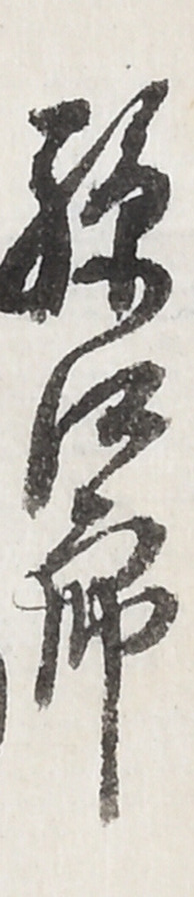孫四郎
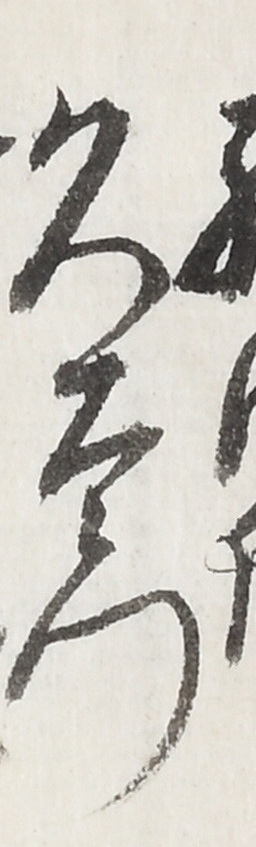久右衛門
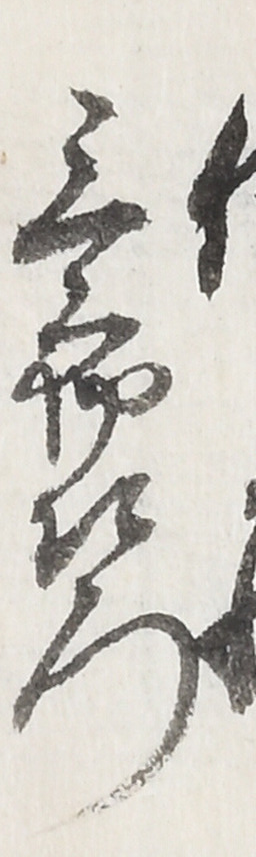三郎左衛門
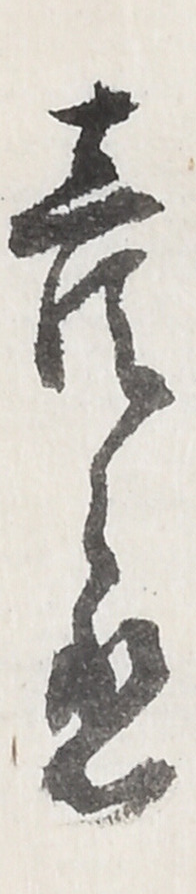清兵衛
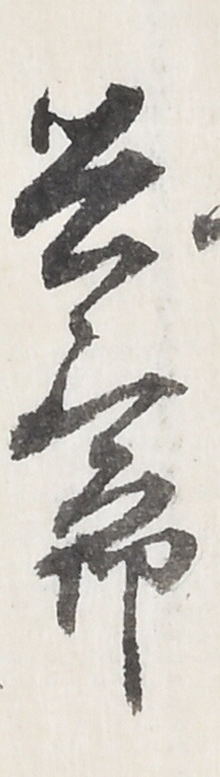兵三郎
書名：御拝地百五拾年御祝儀献上御目録名前
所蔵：伊那市立高遠町図書館・合同会社AMANE
